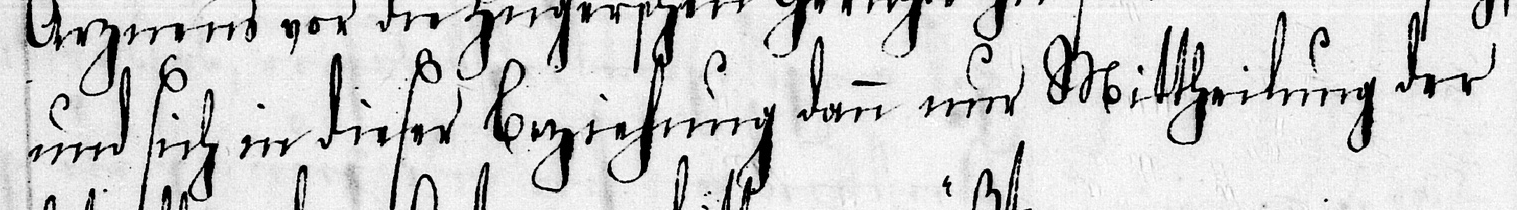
und sich in dieser Beziehung dann nur Mittheilung der
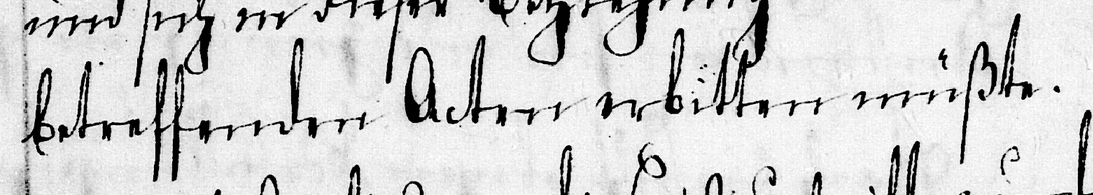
betreffenden Acten erbitten müßte.
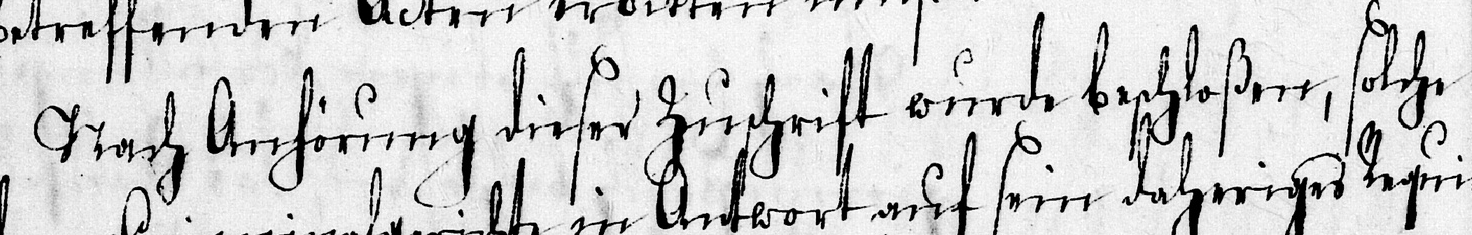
Nach Anhörung dieser Zuschrift wurde beschloßen, solc¬
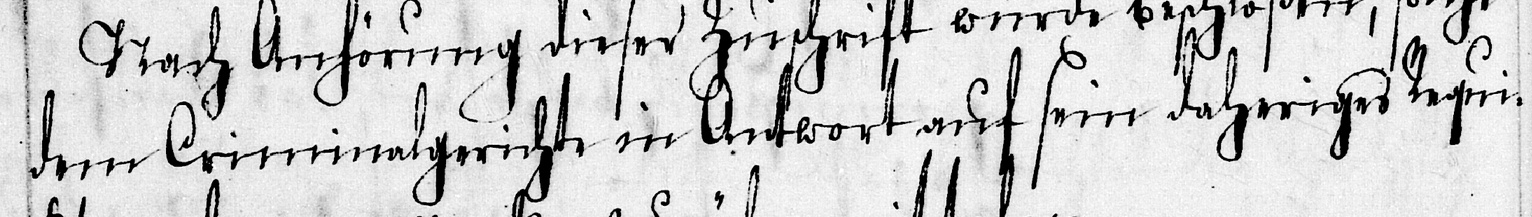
dem Criminalgerichte in Antwort auf sein daheriges Requi¬
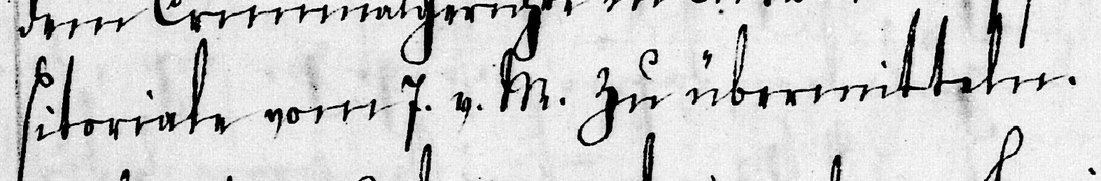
sitoriale vom 7. v. M. zu übermitteln.
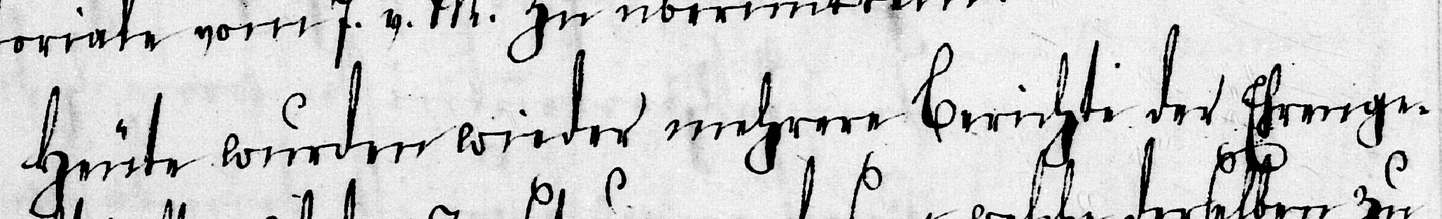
Heute wurden wieder mehrere Berichte der Ehrenges¬
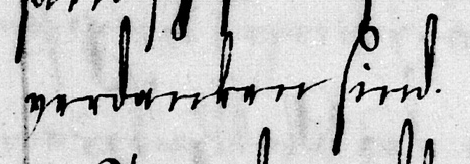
verdanken sind.
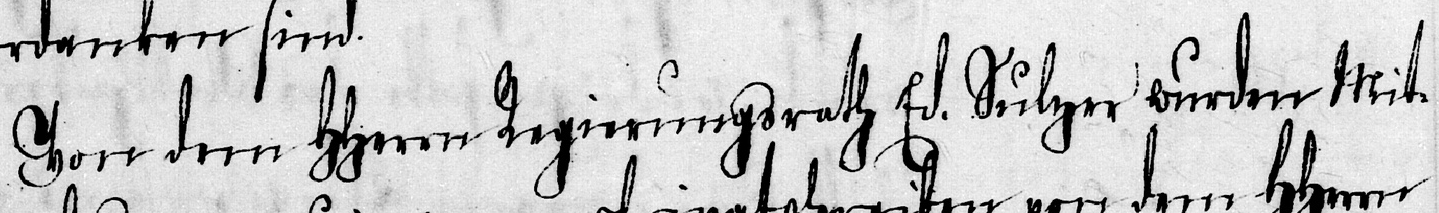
Von dem HHerrn Regierungsrath Ed. Sulzer wurden Mit¬
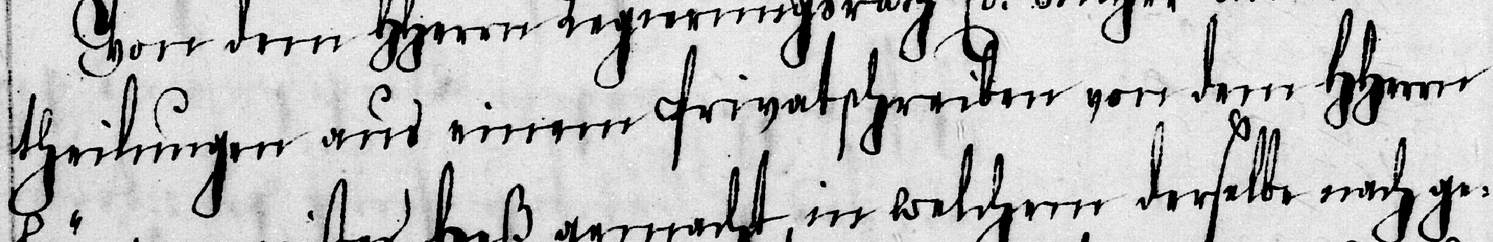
theilungen aus einem Privatschreiben von dem HHerrn
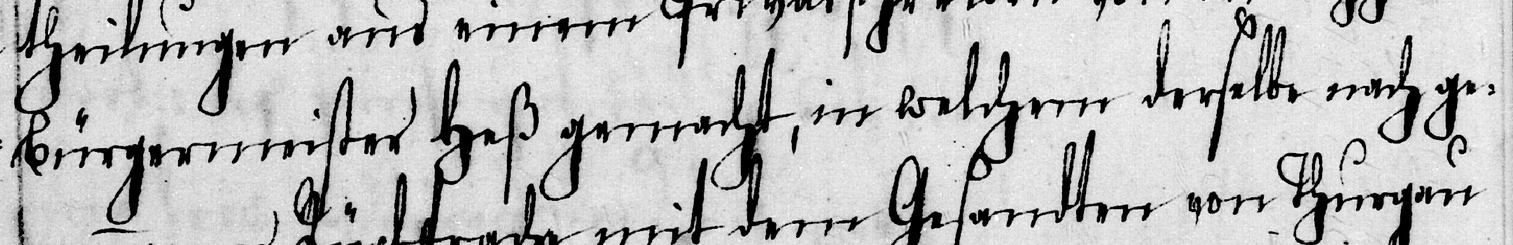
Bürgermeister Heß gemacht, in welchem derselbe nach ge¬
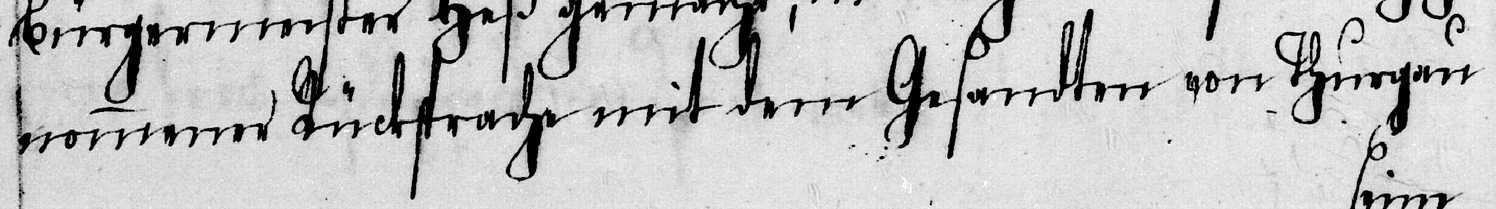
nommener Rücksprache mit dem Gesandten von Thurgau
